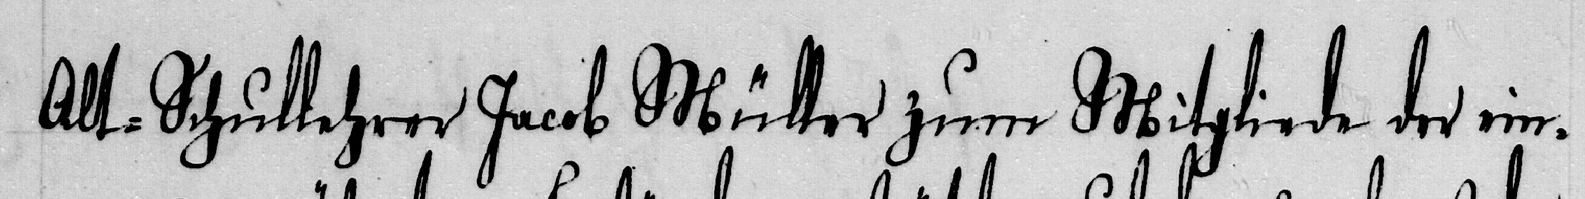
Alt-Schullehrer Jacob Müller zum Mitgliede der ein¬
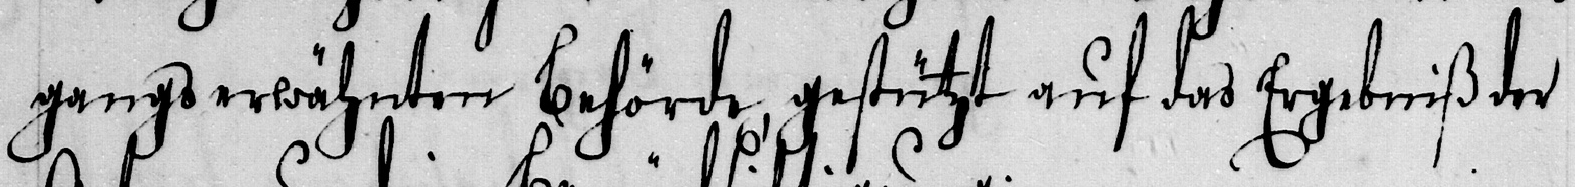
gangs erwähnten Behörde, gestützt auf das Ergebniß der
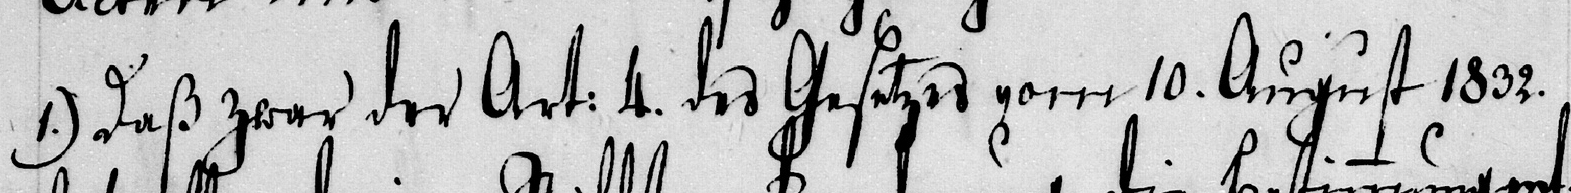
1.) Daß zwar der Art: 4. des Gesetzes vom 10. August 1832.
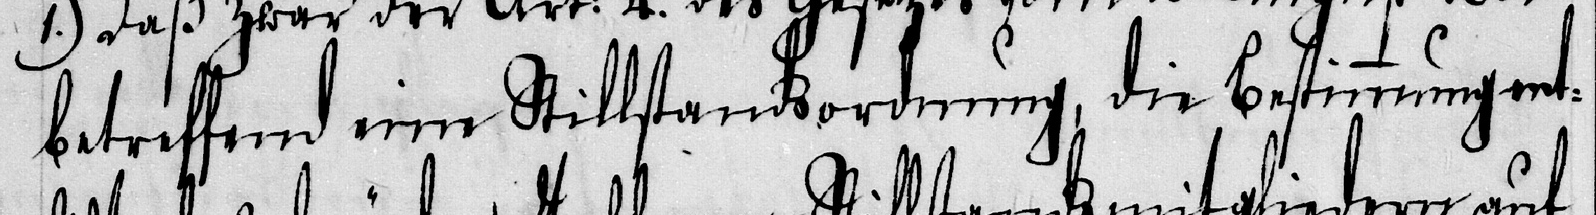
betreffend eine Stillstandsordnung, die Bestimmung ent¬
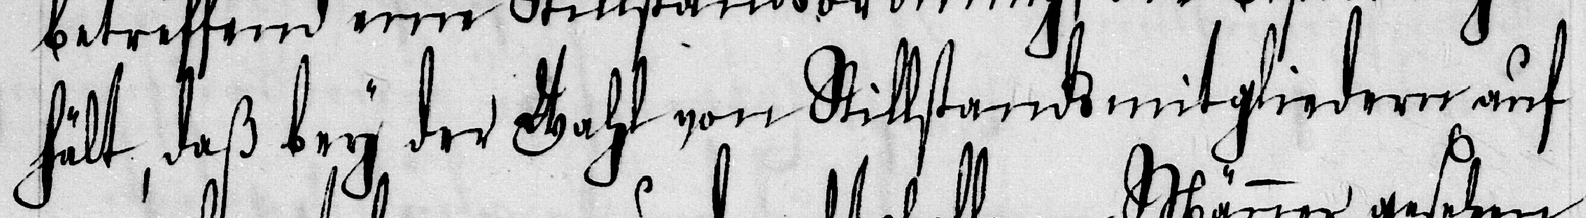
hält, daß bey der Wahl von Stillstandsmitgliedern auf
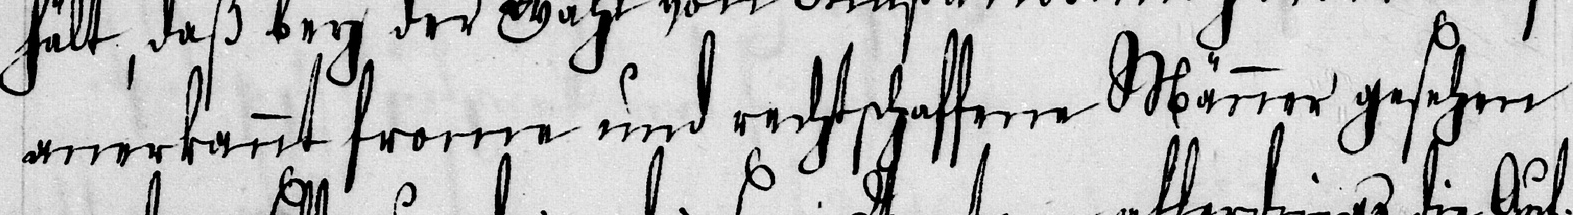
anerkannt frome und rechtschaffene Männer gesehen
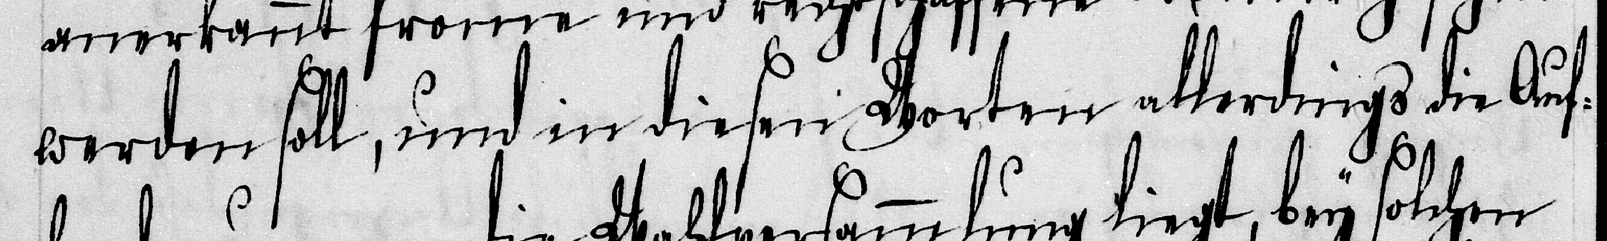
werden soll, und in diesen Worten allerdings die Auf¬
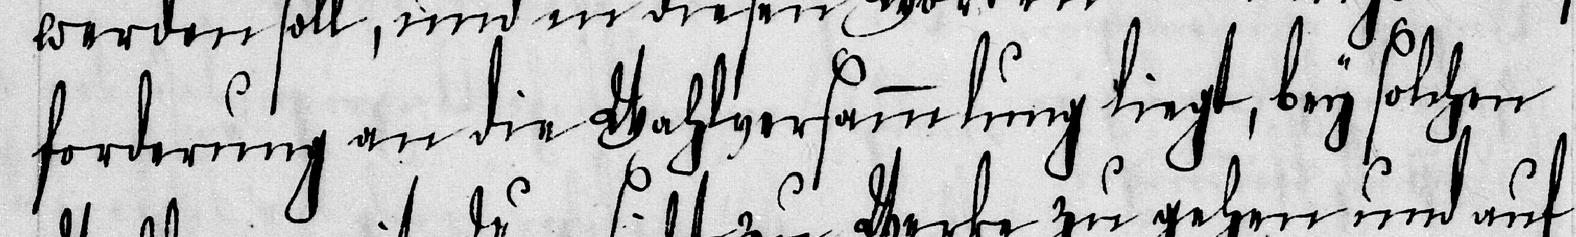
forderung an die Wahlversammlung liegt, bey solchen
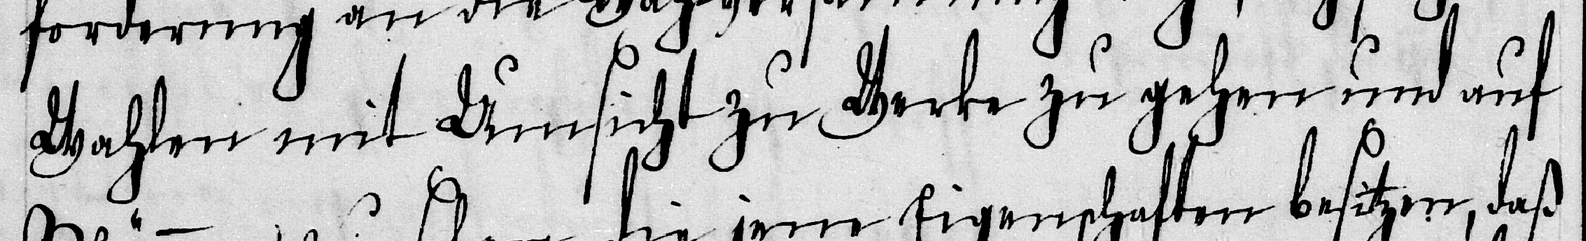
Wahlen mit Umsicht zu Werke zu gehen und auf
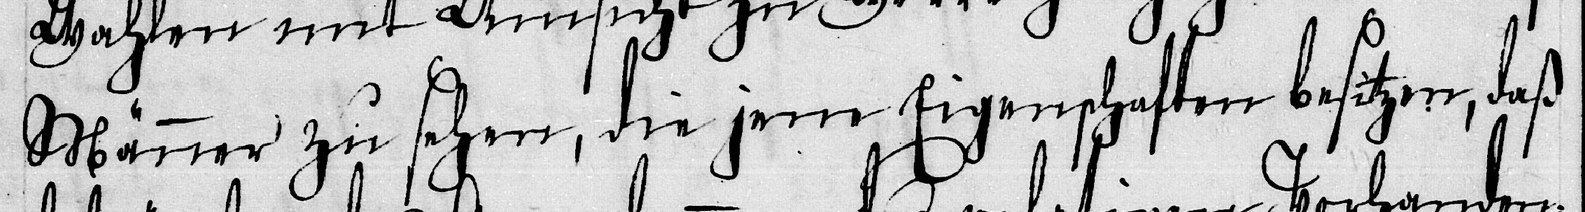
Männer zu sehen, die jene Eigenschaften besitzen, daß
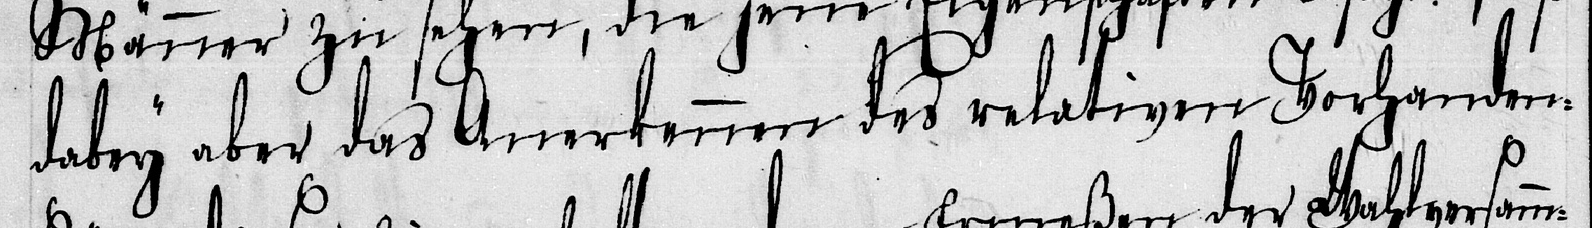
dabey aber das Anerkennen des relativen Vorhanden¬
